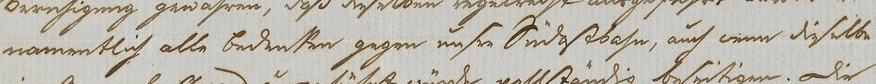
namentlich alle Bedenken gegen unsre Südostbahn, auch wenn dieselbe
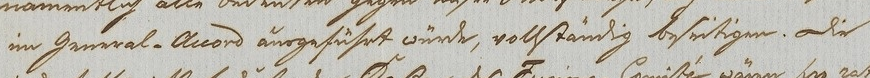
im General-Accord ausgeführt würde, vollständig beseitigen. Die
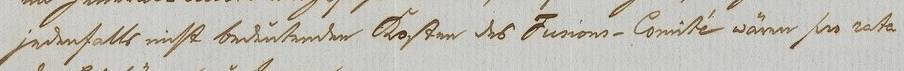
jedenfalls nicht bedeutenden Kosten des Fusions-Comité wären pro rata
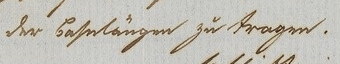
der Bahnlängen zu tragen.
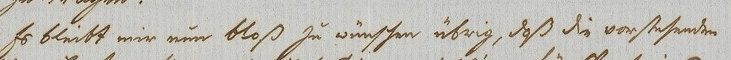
So bleibt mir nun bloß zu wünschen übrig, daß die vorstehenden
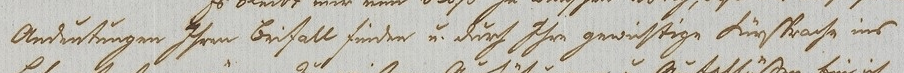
Andeutungen Ihren Beifall finden u. durch Ihre gewichtige Fürsprache ins
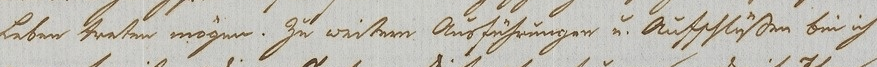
Leben treten mögen. Zu weitern Ausführungen u. Aufschlüßen bin ich
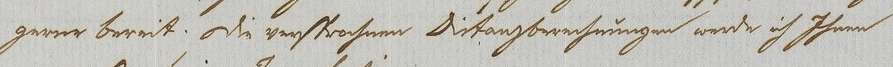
gerne bereit. Die versprochnen Distanzberechnungen werde ich Ihnen
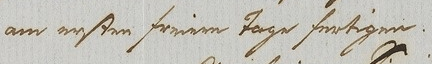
am ersten freiern Tage fertigen.
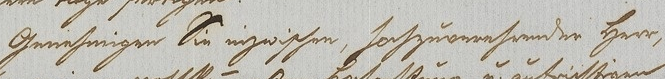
Genehmigen Sie inzwischen, hochzuverehrender Herr,
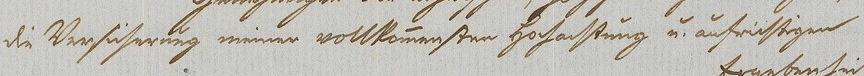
die Versicherung meiner vollkommensten Hochachtung u. aufrichtigen
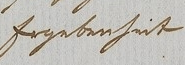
Ergebenheit
